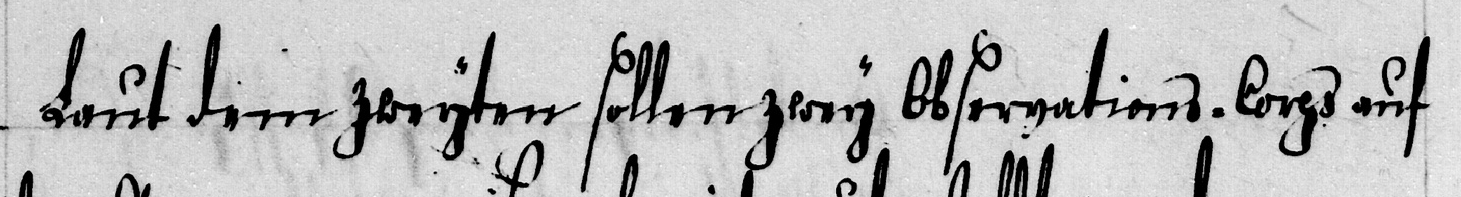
Laut dem zweyten sollen zwey Observations-Corps auf
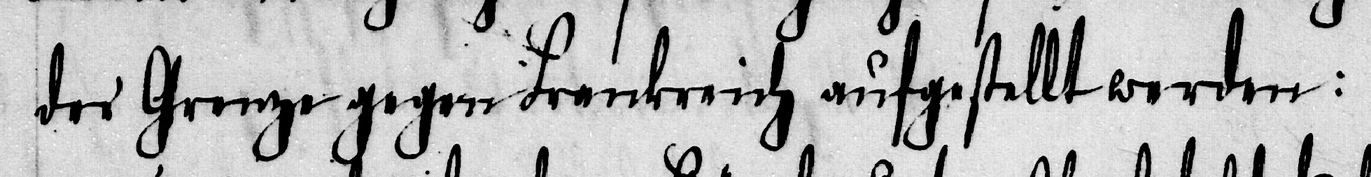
der Grenze gegen Frankreich aufgestellt werden:
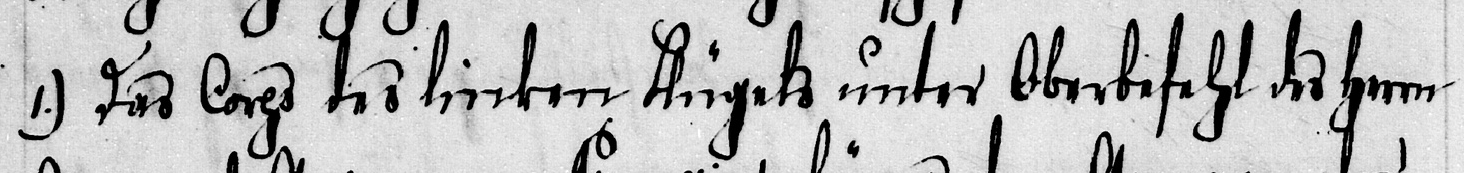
1.) Das Corps des linken Flügels unter Oberbefehl des Herrn
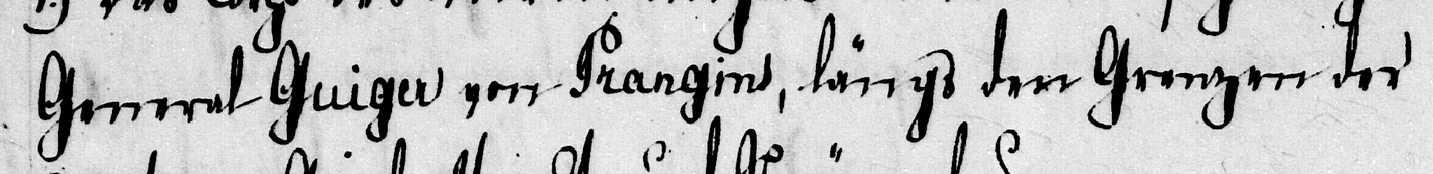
General Guiger von Prangins, längs den Grenzen der
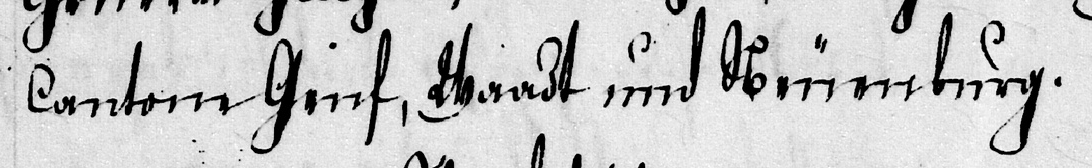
Cantone Genf, Waadt und Neuenburg.
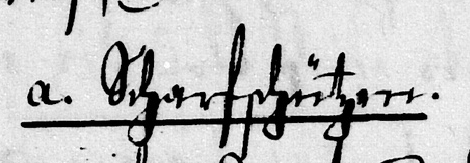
a. Scharfschützen.
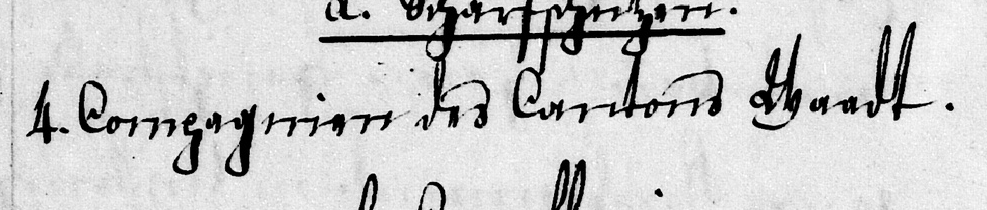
4. Compagnien des Cantons Waadt.
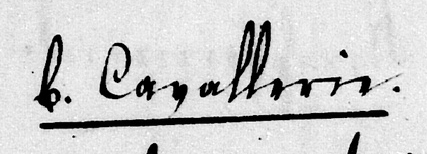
b. Cavallerie.
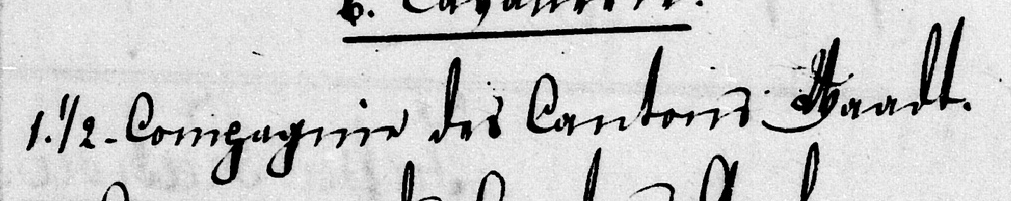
1. ½ Compagnie des Cantons Waadt.
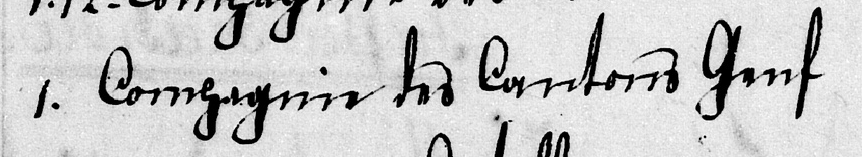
1. Compagnie des Cantons Genf
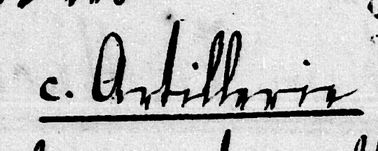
c. Artillerie
